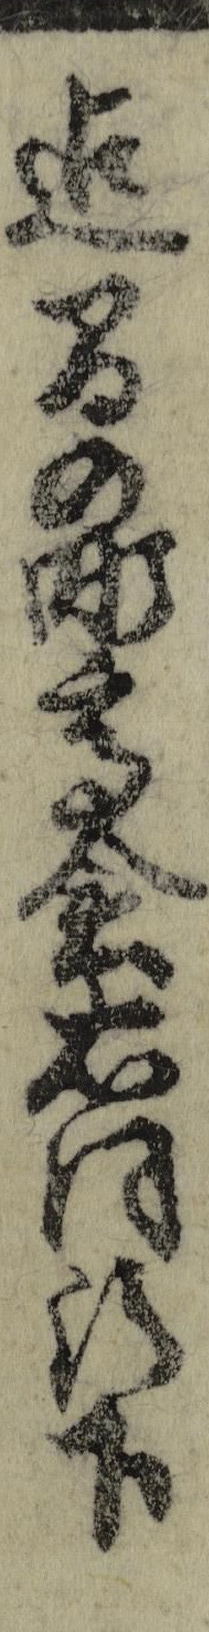迠間の町高倉右同断下
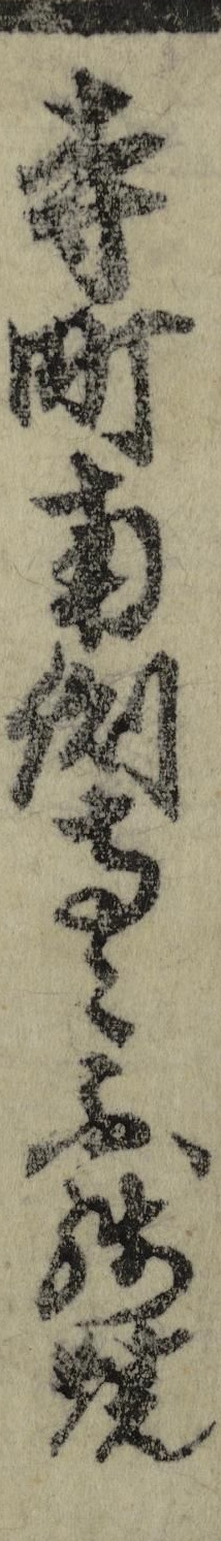寺町南側寺々不残焼
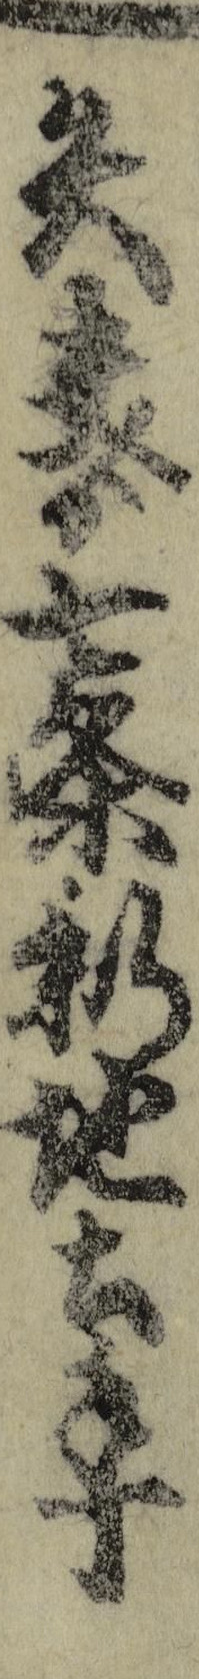失夫ゟ七条新地土手丁
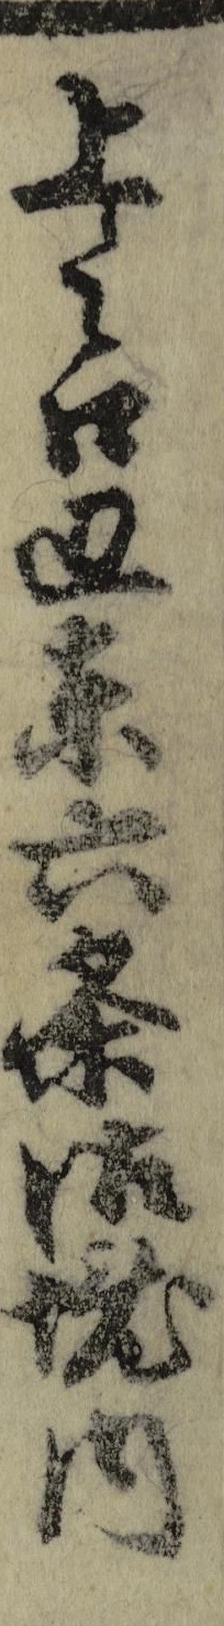上之四辺東六条御境内
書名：京都大火極本しらべ
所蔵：東京大学地震研究所図書室 Earthquake Research Institute Library, The University of Tokyo, JAPAN
